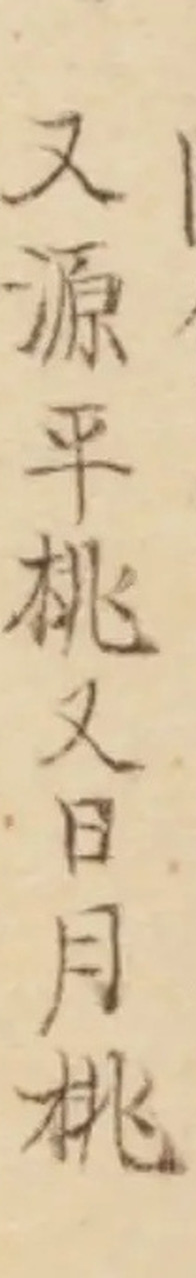又源平桃又日月桃
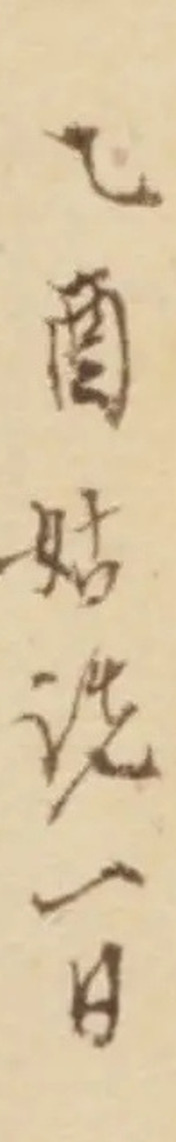乙酉姑洗一日
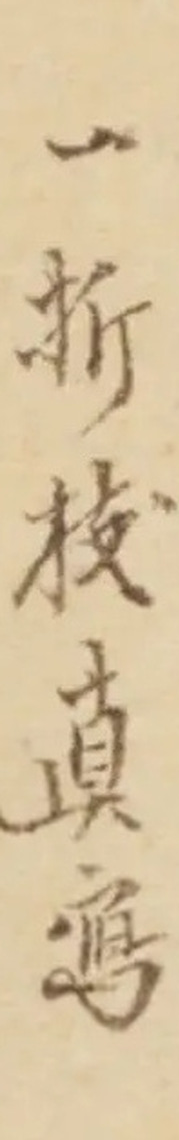一折枝真写

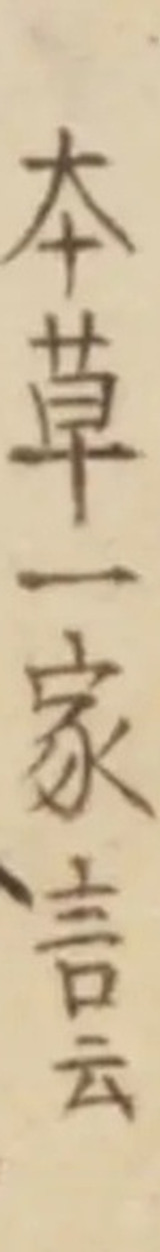本草一家言云
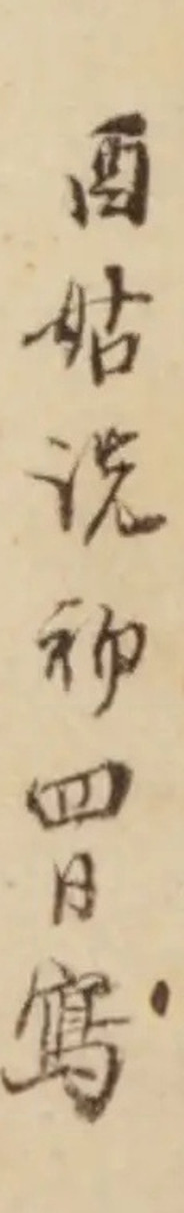酉姑洗初四日写
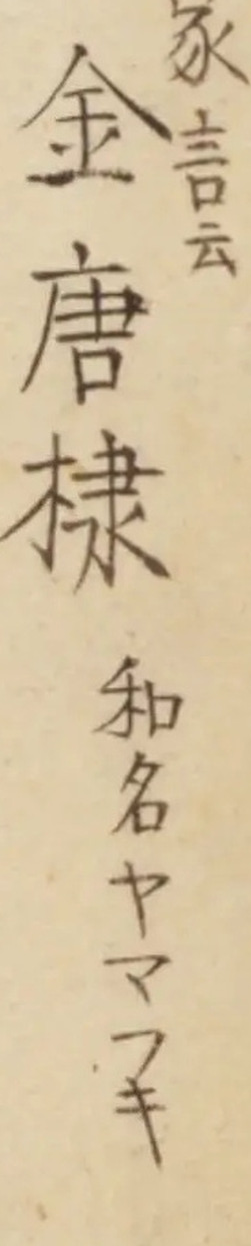金唐棣和名ヤマフキ
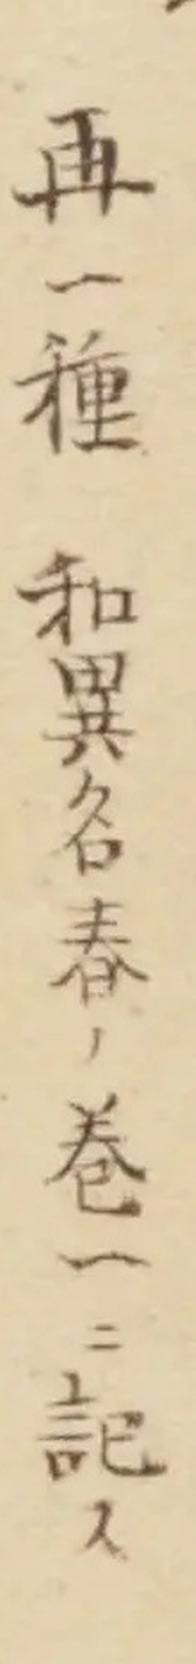再一種和異名春ノ巻一ニ記ス
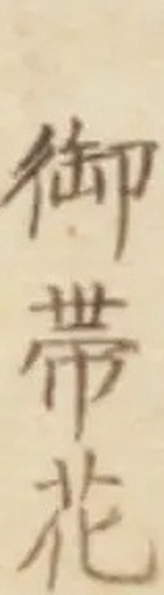御帯花
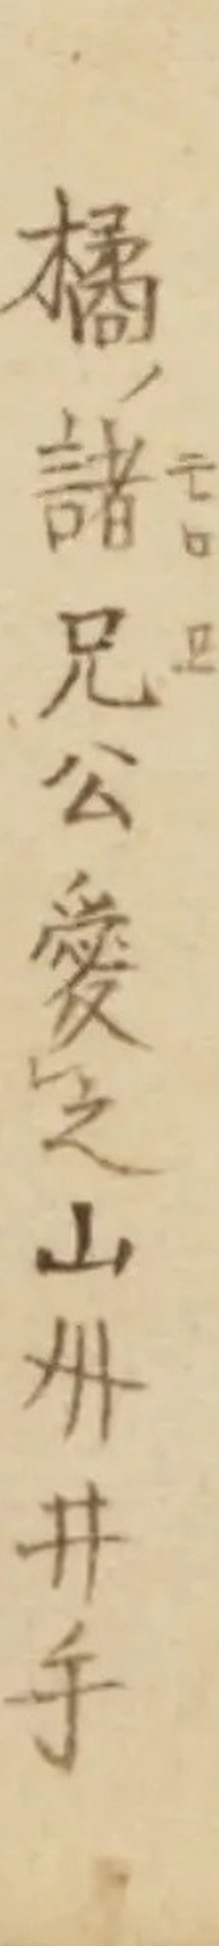橘諸兄公愛之山州井手
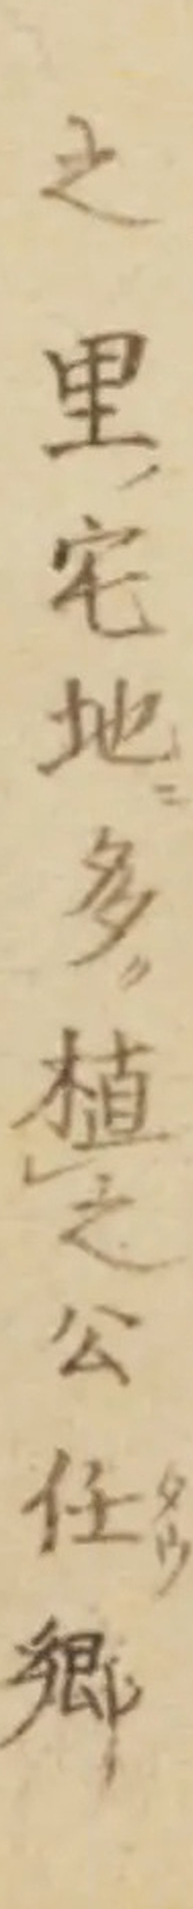之里ノ宅地ニ多ク植之公任郷
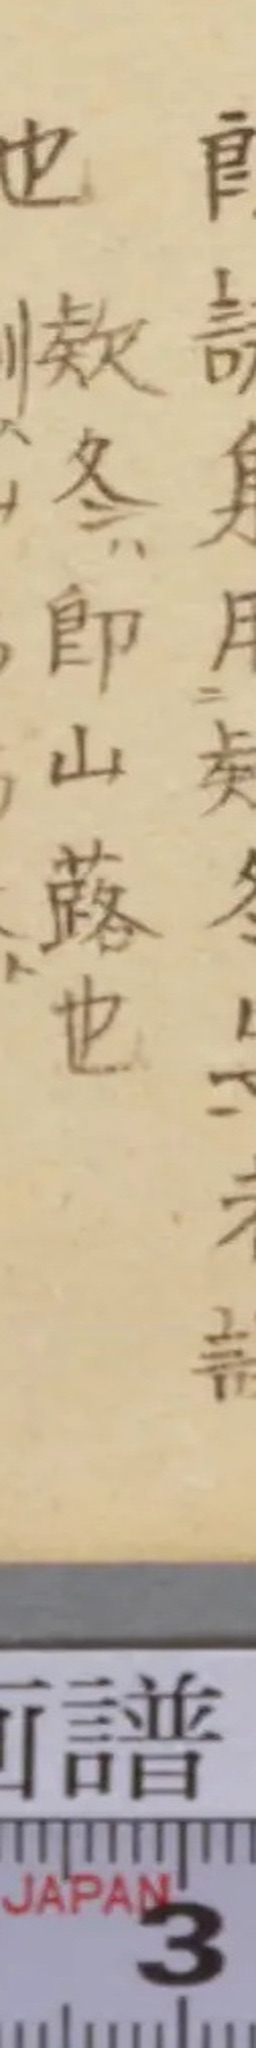也款冬即山蕗也

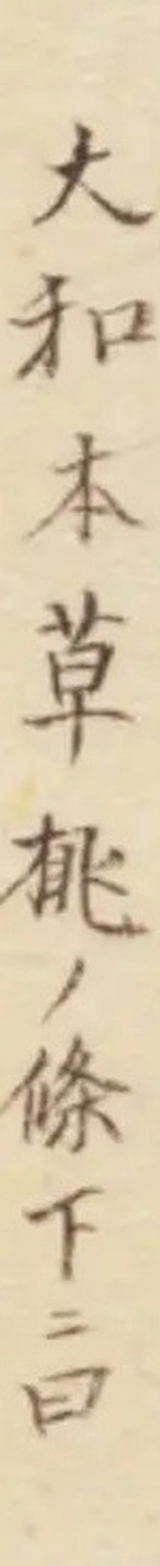大和本草桃ノ条下ニ曰
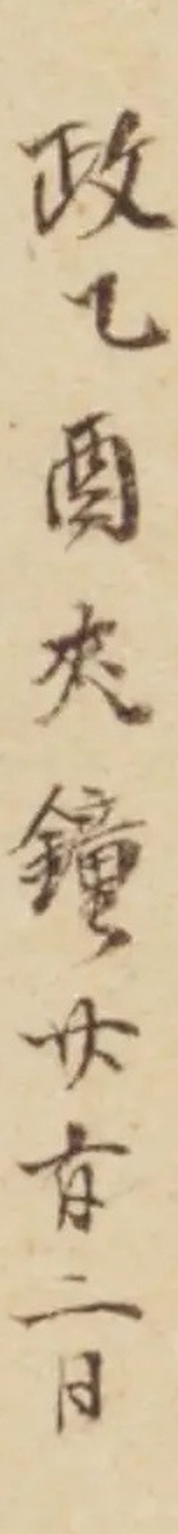政乙酉夾鐘廿有二日
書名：梅園草木花譜春之部. 2
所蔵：国立国会図書館 National Diet Library, JAPAN
